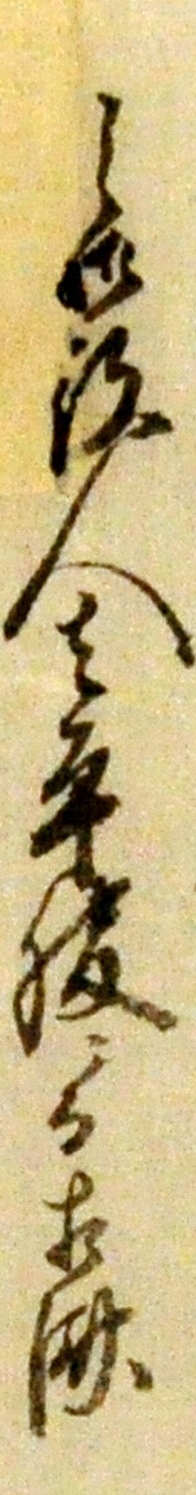之御役人者平服ニ而相済
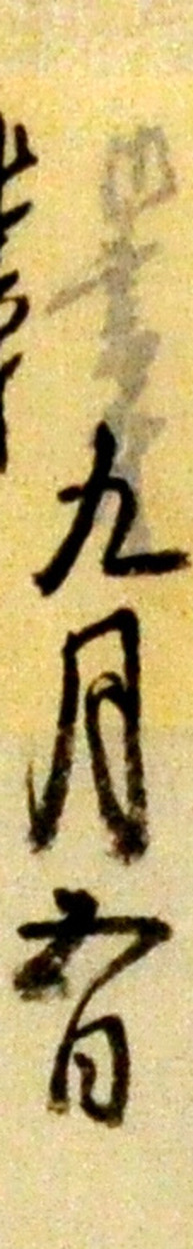九月五日
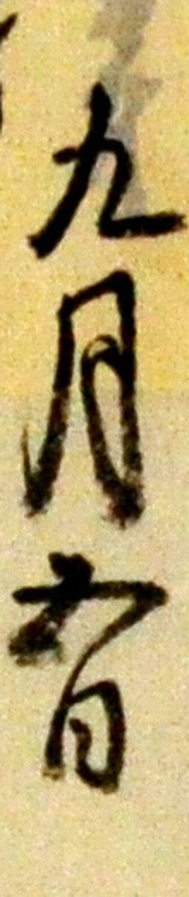九月五日
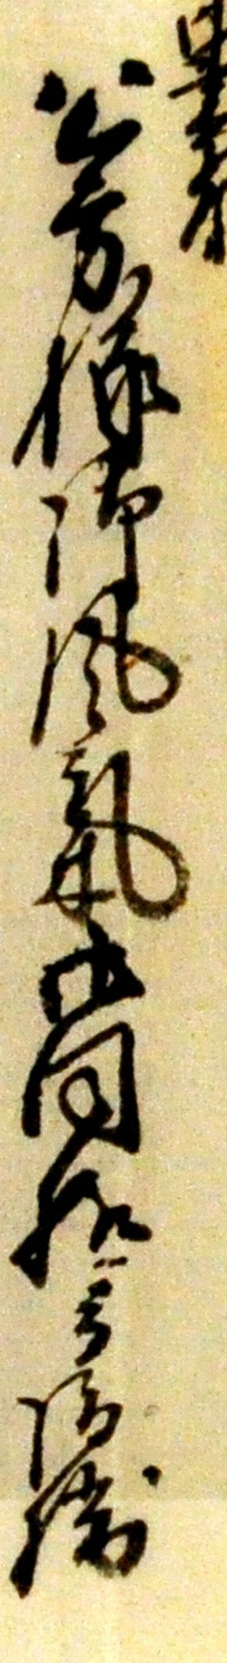公方様御風気御同様ニ而御勝
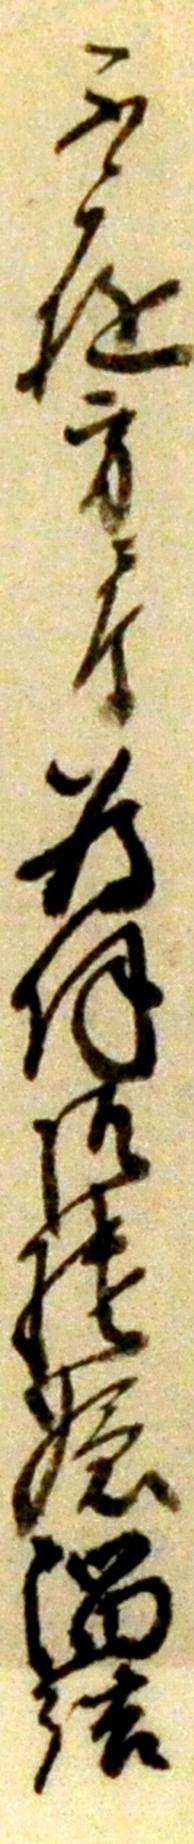不被遊方ニ付為伺御機嫌溜詰
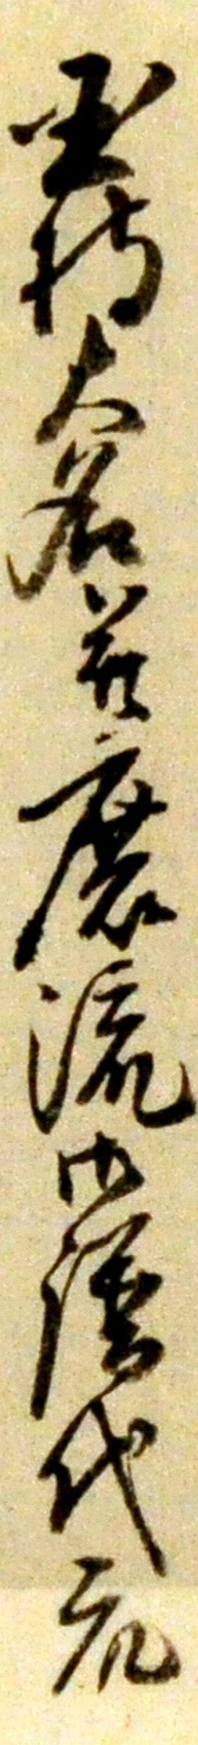国持大名并庶流御譜代衆
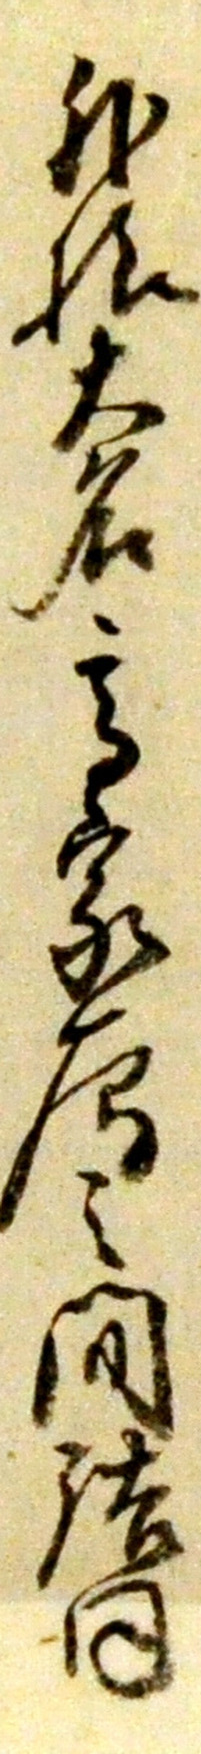外様大名高家鳫之間詰同
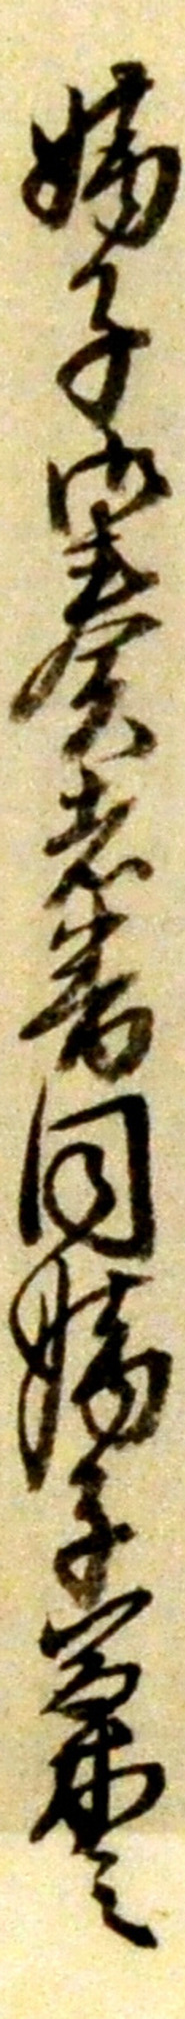嫡子御奏者番同嫡子菊之
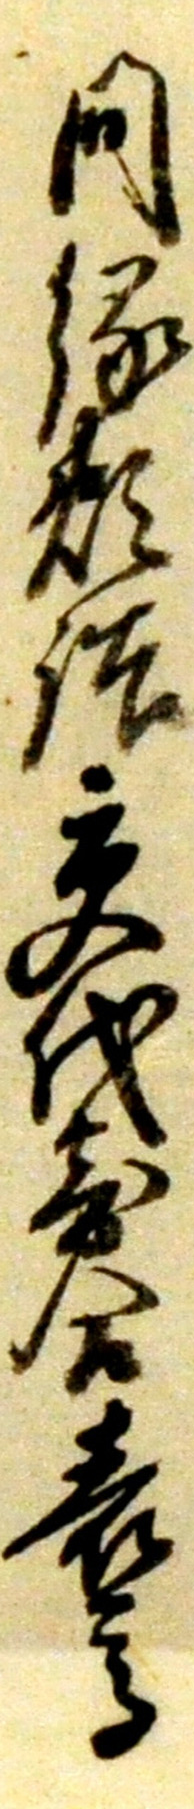間縁頬詰交代寄合表高
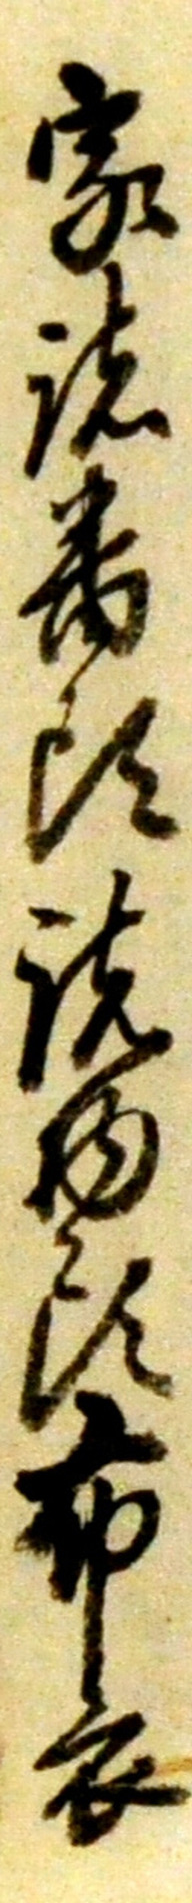家諸番頭諸物頭布衣
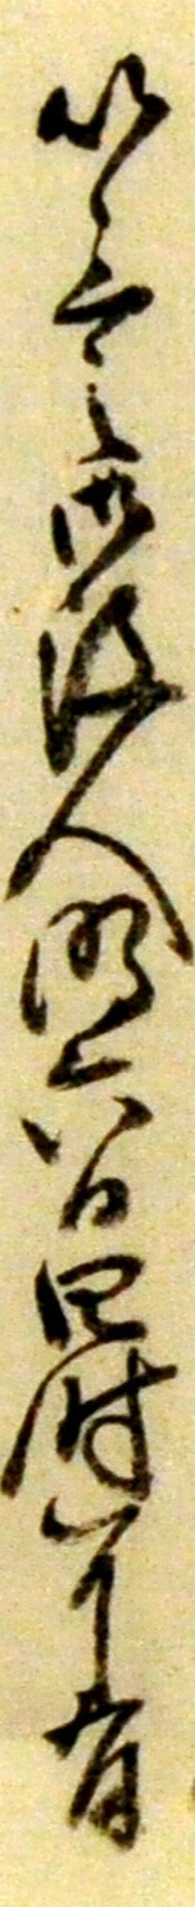以上之御役人明六日四時可有
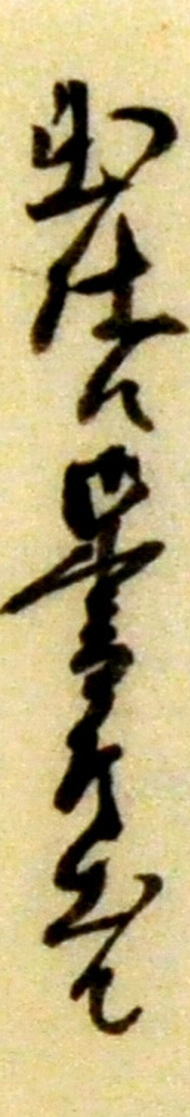出仕候御書付出候
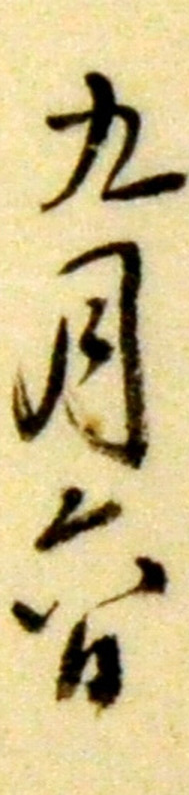九月六日

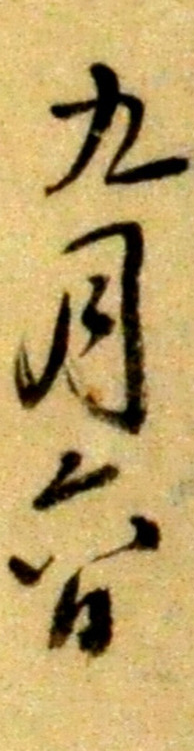九月七日
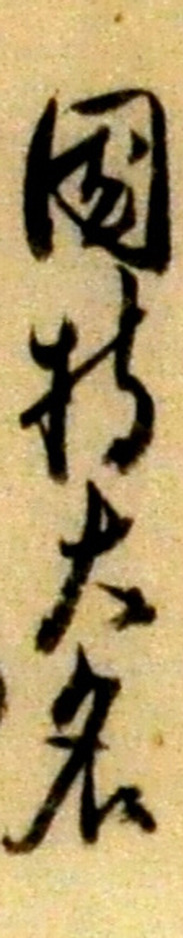国持大名
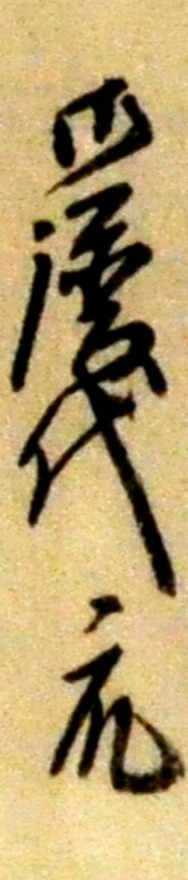御譜代衆
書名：書抜
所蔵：伊那市立高遠町図書館・合同会社AMANE
